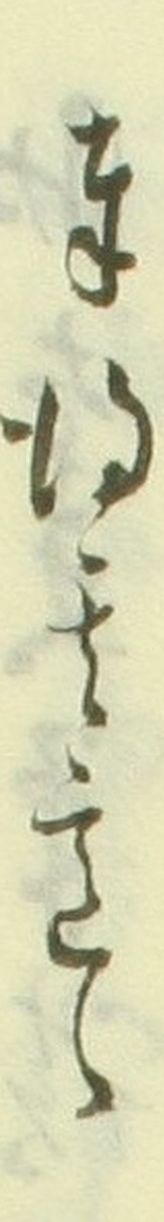奉得其意候
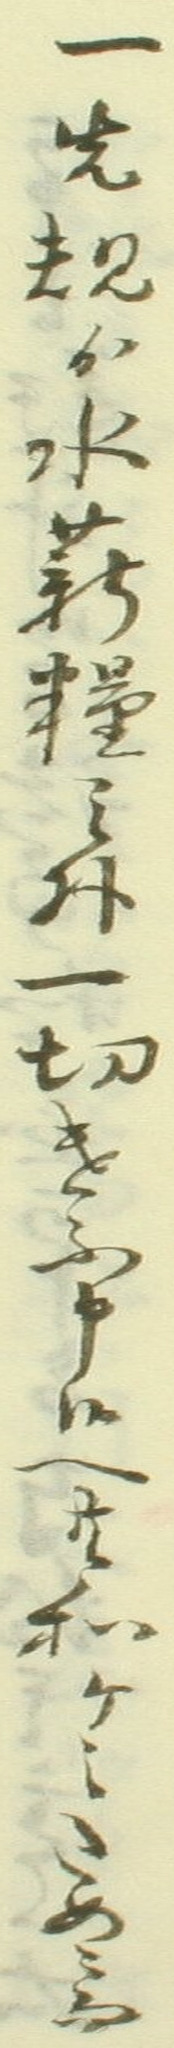一先規ゟ水薪糧之外一切遣不申候へ共和ヶ之ために而
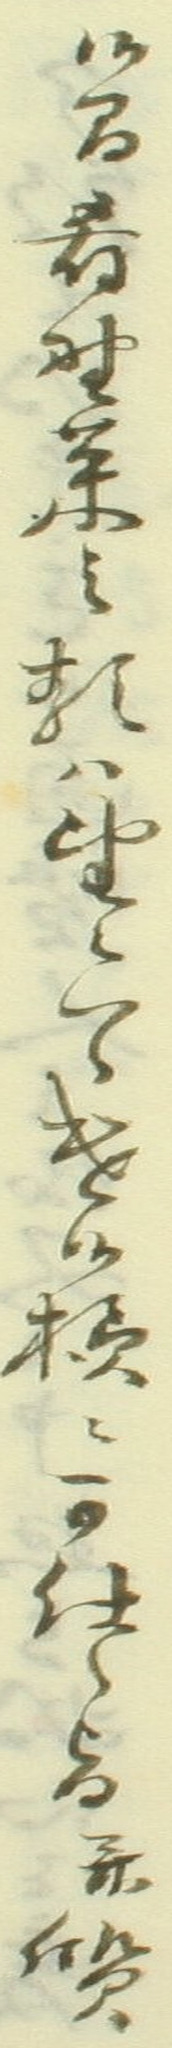候間肴野菜之類は望候はゝ遣候様に可仕之旨并質
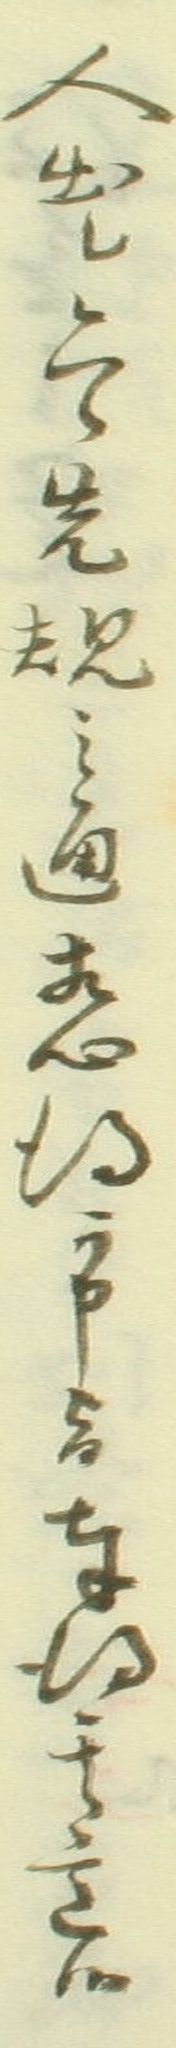人出し候はゝ先規の通相心得可申旨奉得其意候
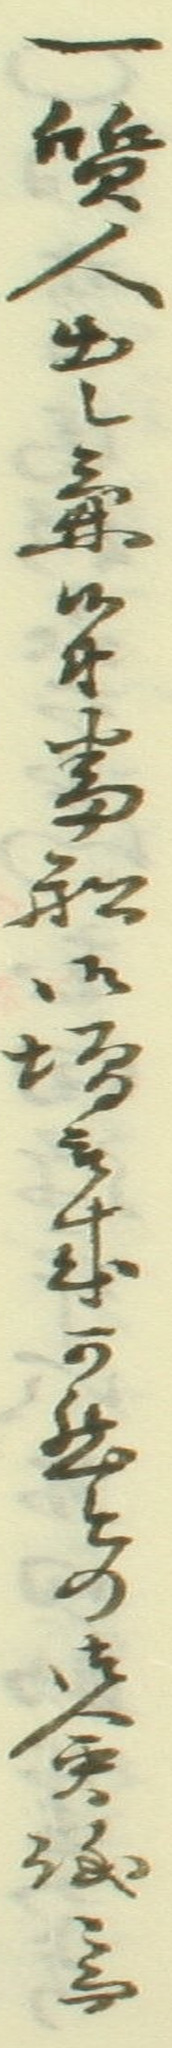一質人出し兼候付番船御増被成可然との御僉儀に而
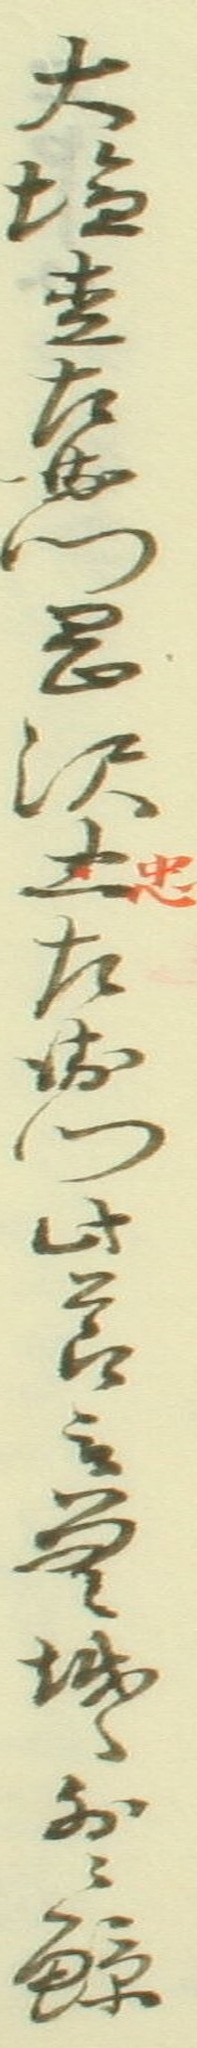大塩杢左衛門岡沢忠左衛門此節被差越候別に鯨
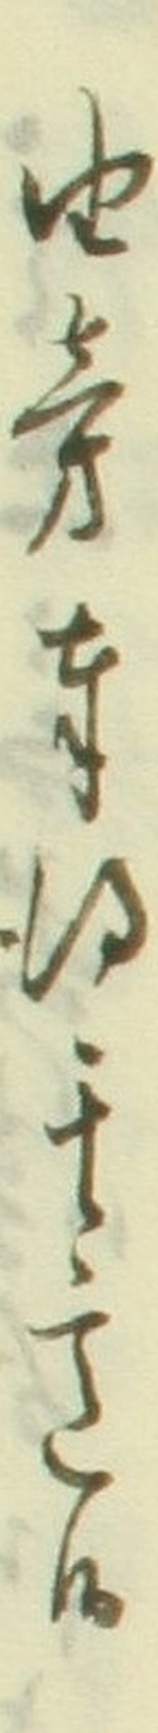由旁奉得其意候
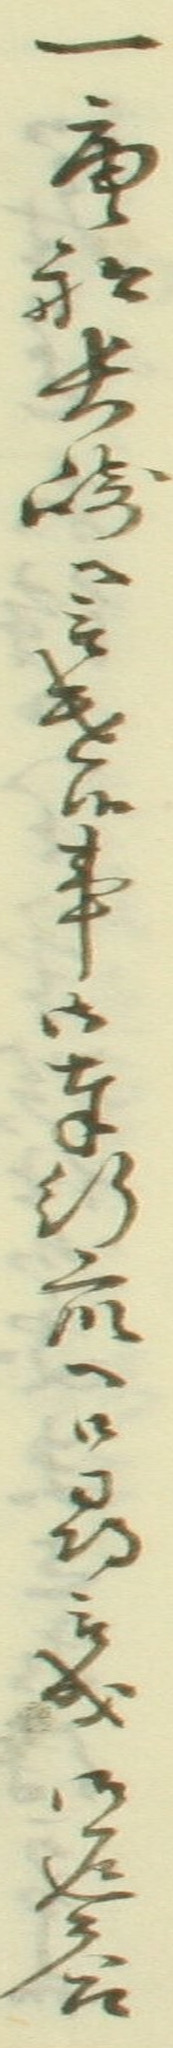一唐船長崎へ被遣候事御奉行衆へ御尋被成御返答

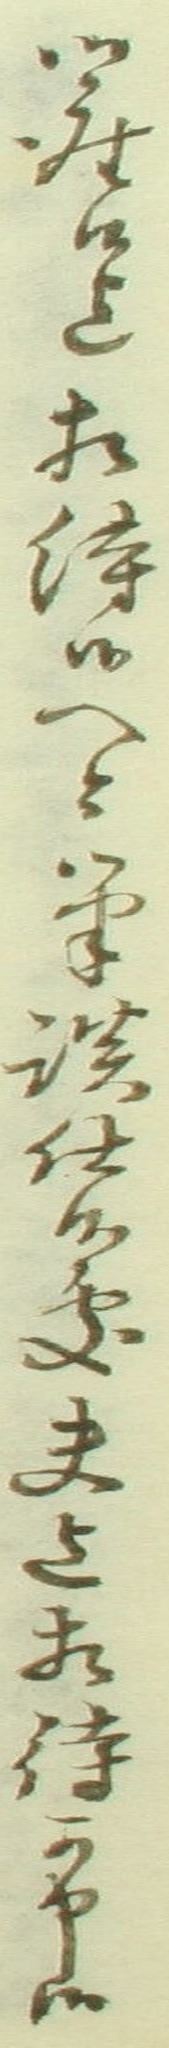御座候迄相侍候へと筆談仕候処夫迄相侍可申候
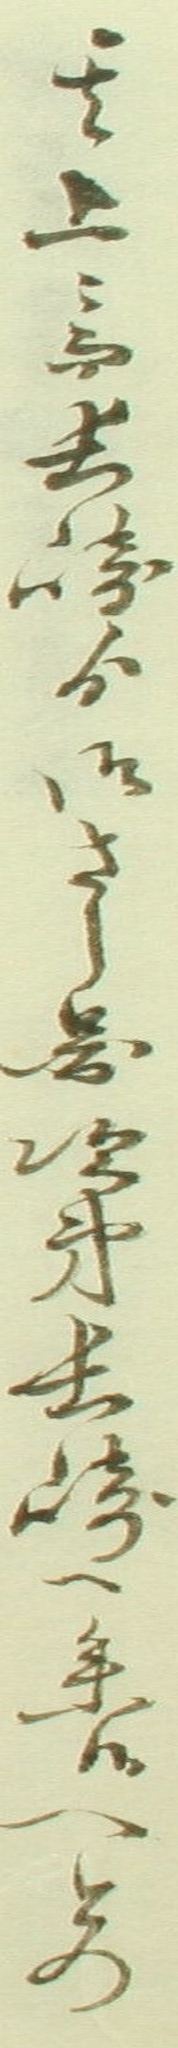其上に而長崎ゟ御さし図次第長崎へ参候へとの
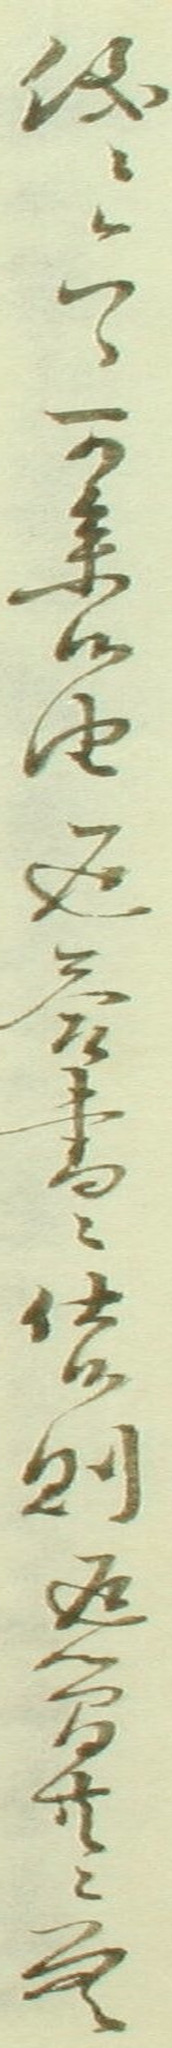儀に候はゝ可参候由返答書に仕候則返簡共に差
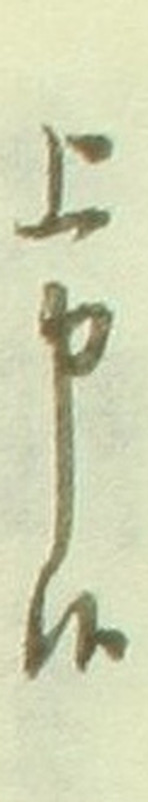上申候
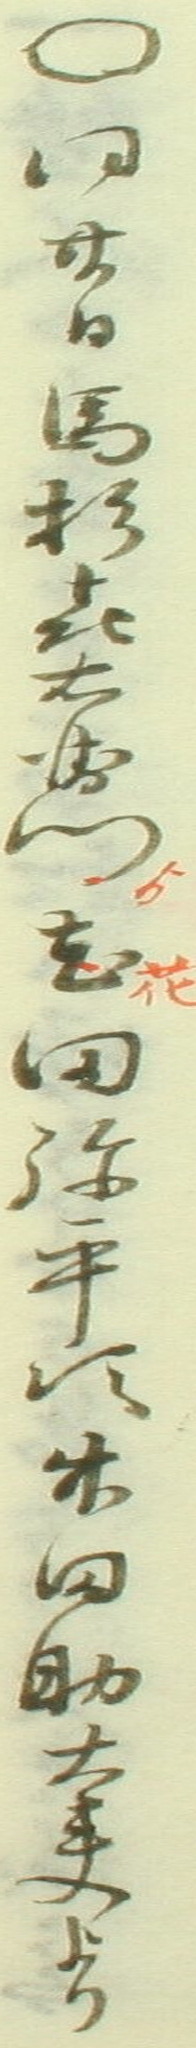〇同廿日馬杉喜右衛門尤花田弥平次竹田助太夫より
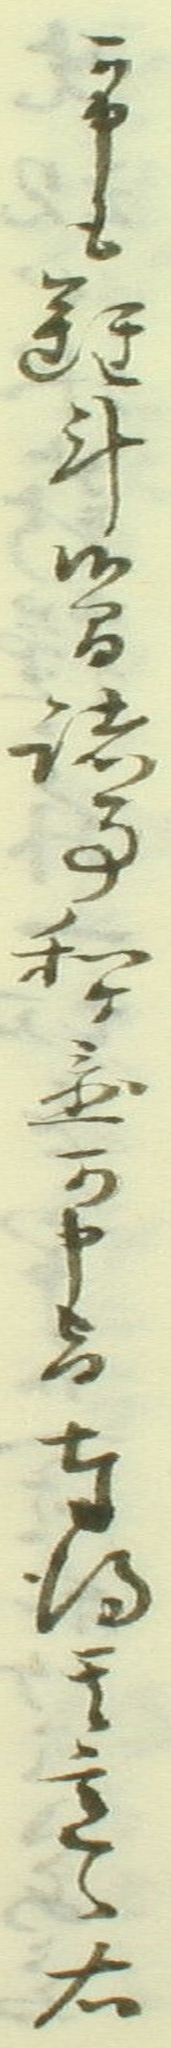可申も難計候間諸事和ヶ置可申旨奉得其意候右
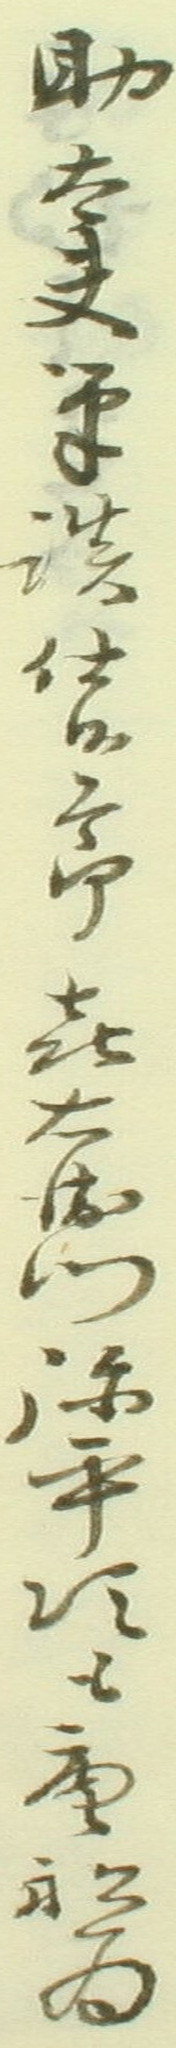助太夫筆談仕候節喜右衛門弥平次も唐船為
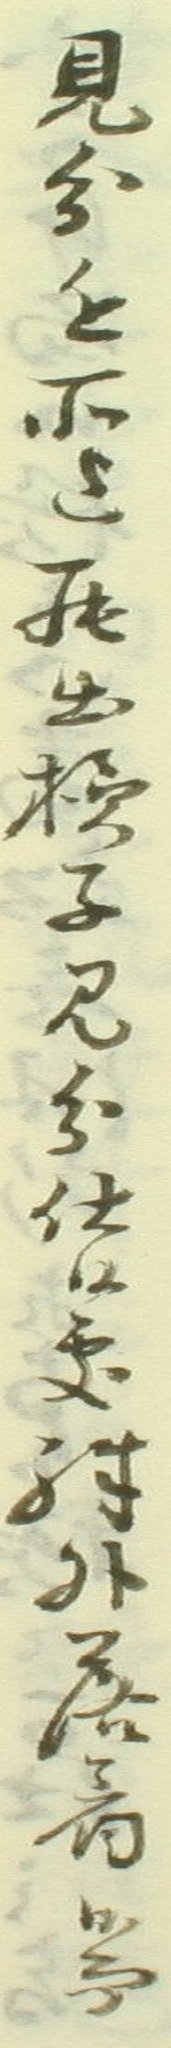見分近所迄罷出様子見分仕候処殊外落着候而
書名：異国船漂着記
